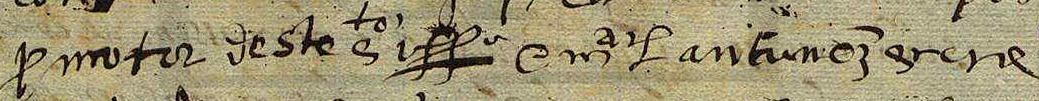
ꝓmotor deste sto offo e maeL antunez̄ secre
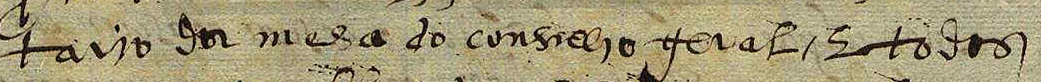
tairo da mesa do conselho geraL / E todos
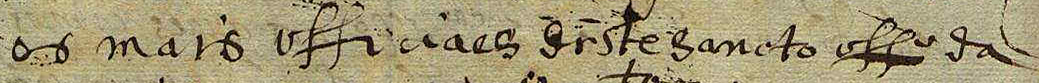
os mais officiaes deste sancto offo da
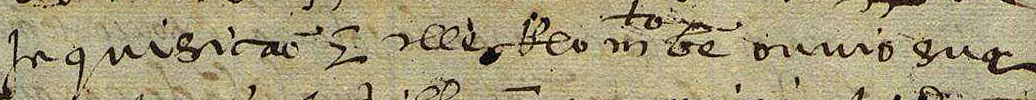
Jnquisiçaõ E elle Reo mto bē ouuio sua
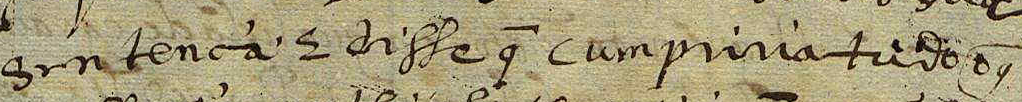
sentença E disse q̄ cumpriria tudo o q̄
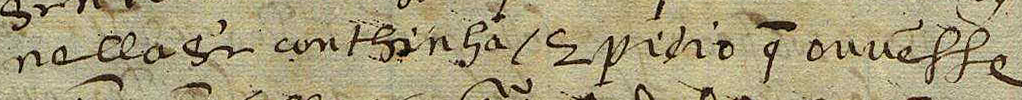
nella se conthinha / E pidio q̄ ouuesse
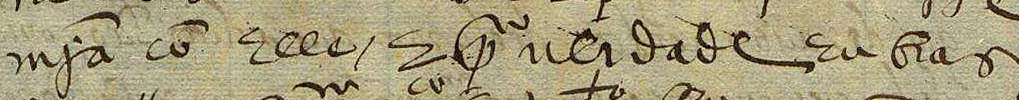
mj̄a cō Elle / E p̄o uerdade Eu bras
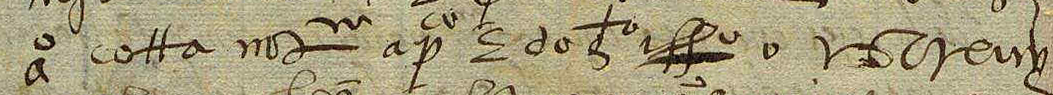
ao cotta notro apco E do sto offo o escreuy
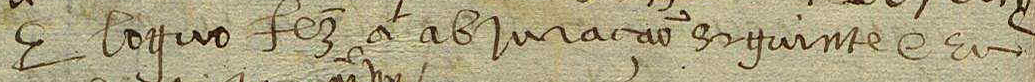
E loguo fez̄ a abjuraçaõ seguinte e Eu
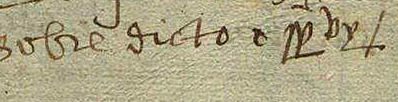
sobredicto o sp̄vy /
